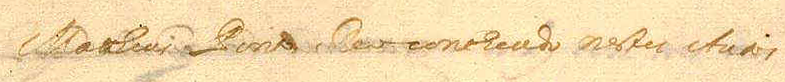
Mattheus Pinto Reo contheudo nestes Autos
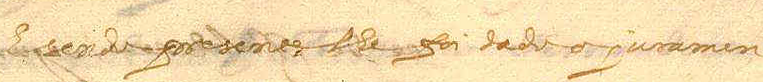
E sendo presente lhe foi dado o juramen
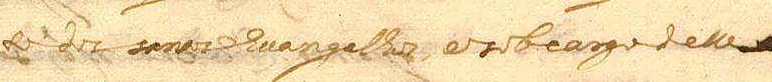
to dos santos Euangelhos e sob cargo delle
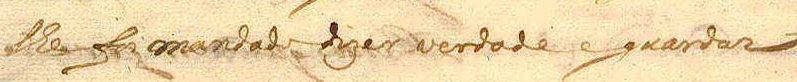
lhe foi mandado dizer verdade e guardar
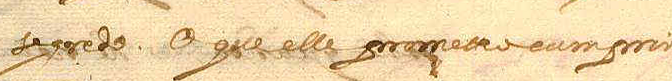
segredo. O que elle prometeo cumprir.
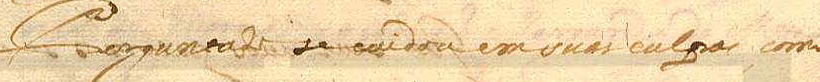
Perguntado se cuidou em suas culpas, como
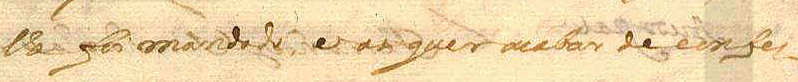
lhe foi mandado, e as quer acabar de confes
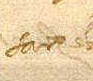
sar?
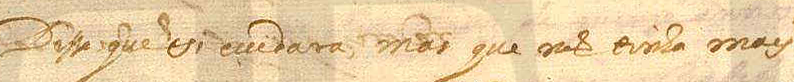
Disse que si cuidara, mas que naõ tinha mais
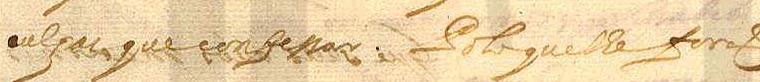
culpas que confessar. Polo que lhe foraõ
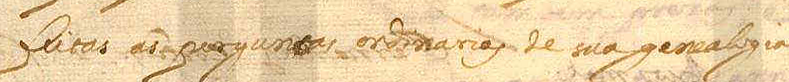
feitas as perguntas ordinarias de sua genealogia.
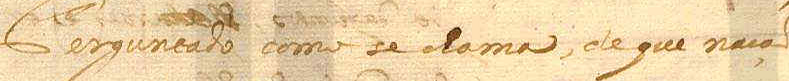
Perguntado como se chama, de que naçaõ,
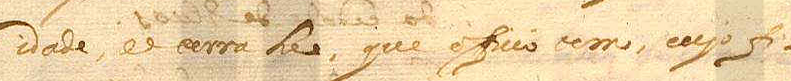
idade, e terra he, que officio tem, cujo fi
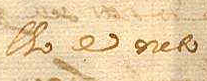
lho e neto?
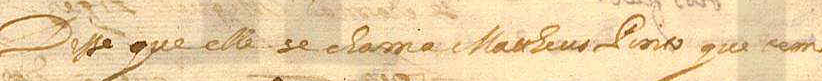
Disse que elle se chama Mattheus Pinto que tem
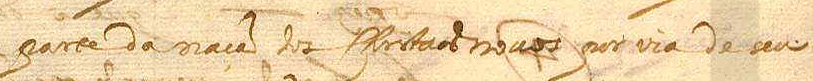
parte da naçaõ dos Christaõs nouos por via de seu
